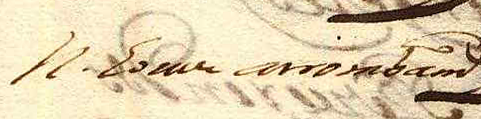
n. houve arrombamto
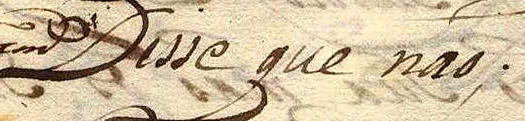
Disse que não;
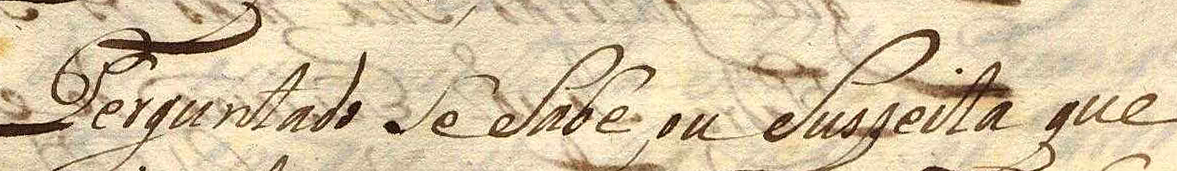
Perguntado se Sabe, ou Suspeita que
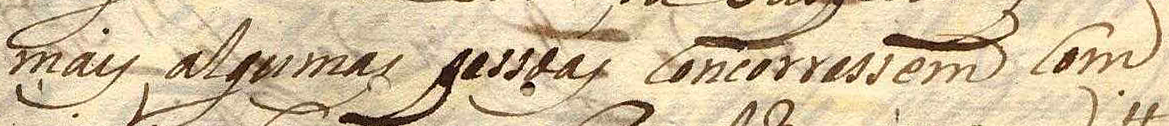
mais algumas pessoas concorressem com
